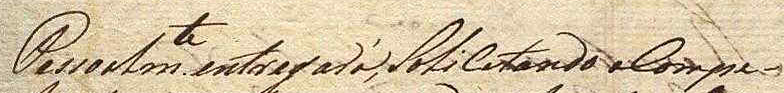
Pessoalm.te entregada, SoliCitando a Compe
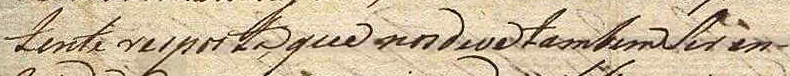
tente resposta, que nos deve tambem Ser en
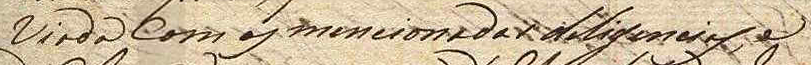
viada com as mencionadas deligencias, e
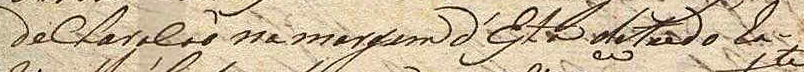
deClaraÇaõ na margem d'Esta de tudo ha
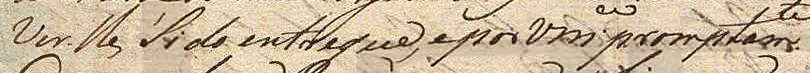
Ver-lhe Sido entregue, e por vm.ce promptam.te
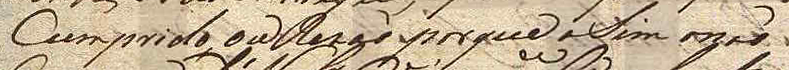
Cumprido, ou Rezaõ porque aSim o naõ
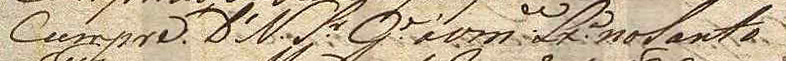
Cumpre. D̄ N. S.r G.r a vm.ce Lx.a no Santo
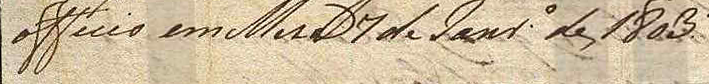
officio em Meza 7 de Ianr.o de 1803.
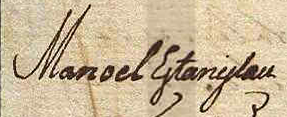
Manoel Estanistau
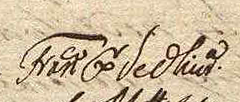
Franco xr de Oliur.a
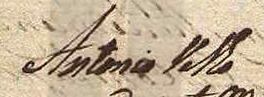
Antonio Velho
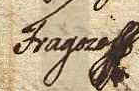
Fragozo
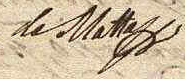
da Matta
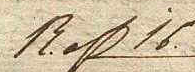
R. a f 16.
